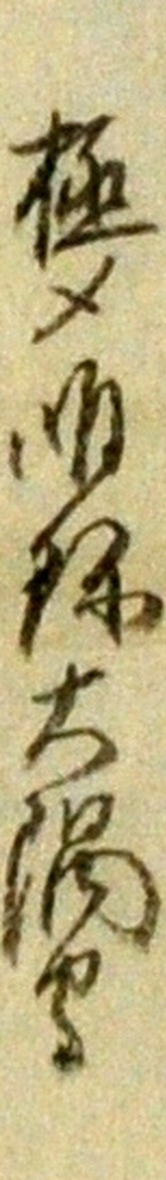極メ明珍大隅守
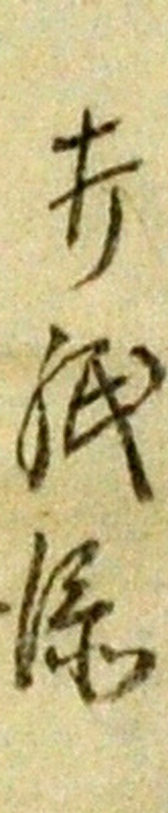打紙添
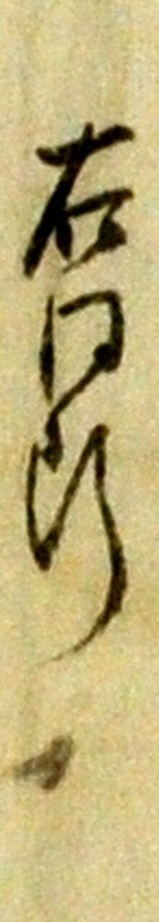右同断
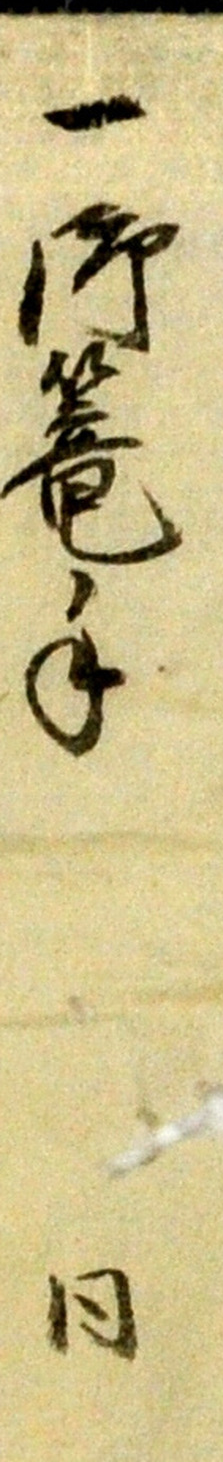一御篭手同
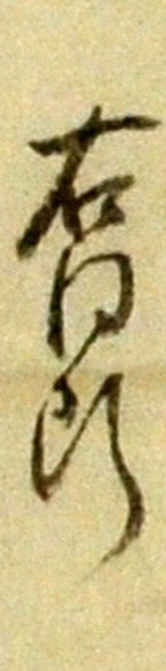右同断
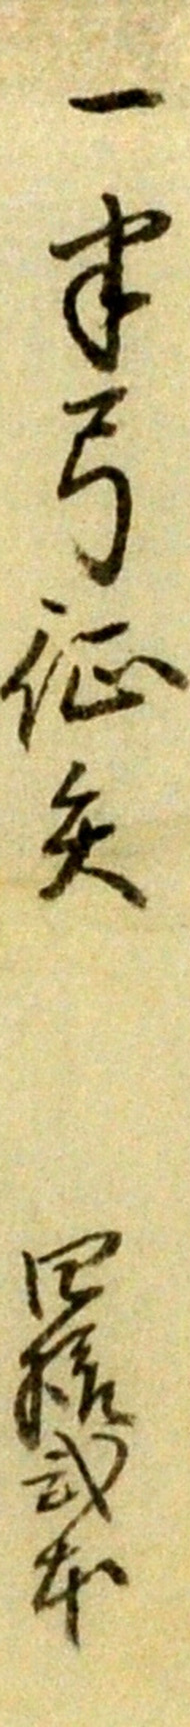一半弓征矢四拾弐本
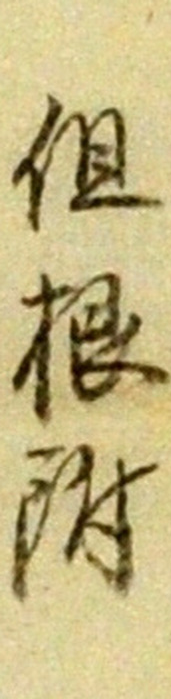但根附
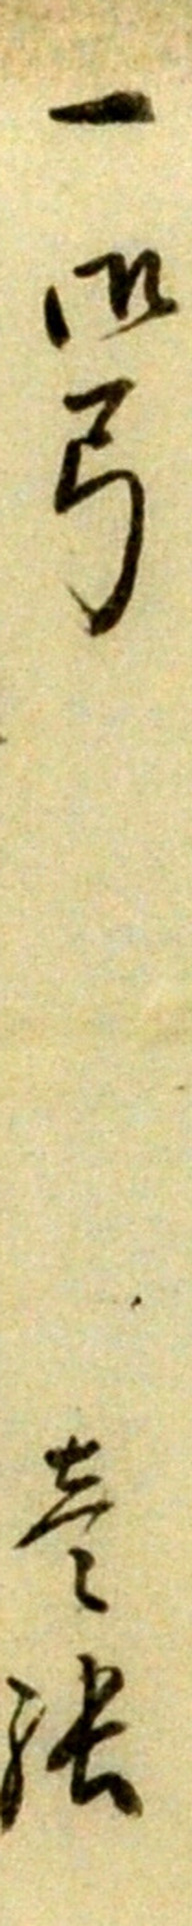一御弓壱張
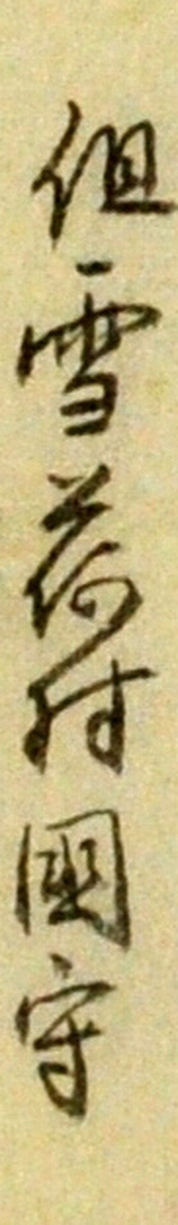但雪荷村国守
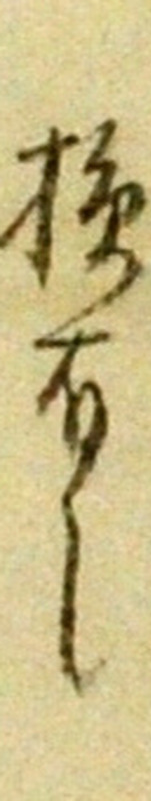損有之
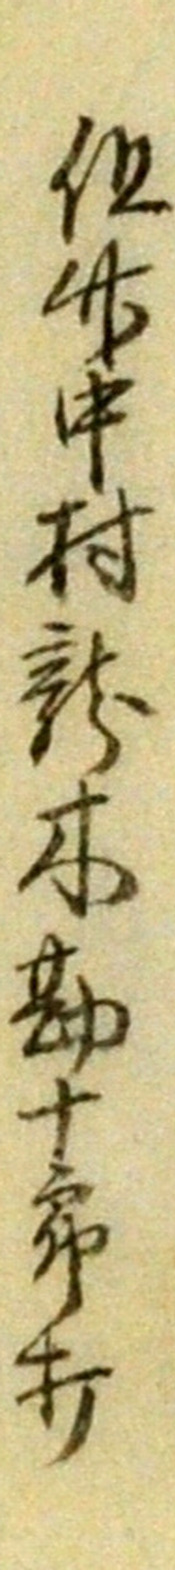但竹中村龍木勘十郎打
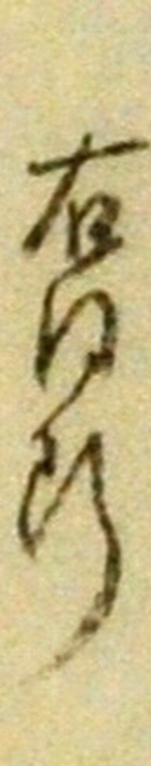右同断
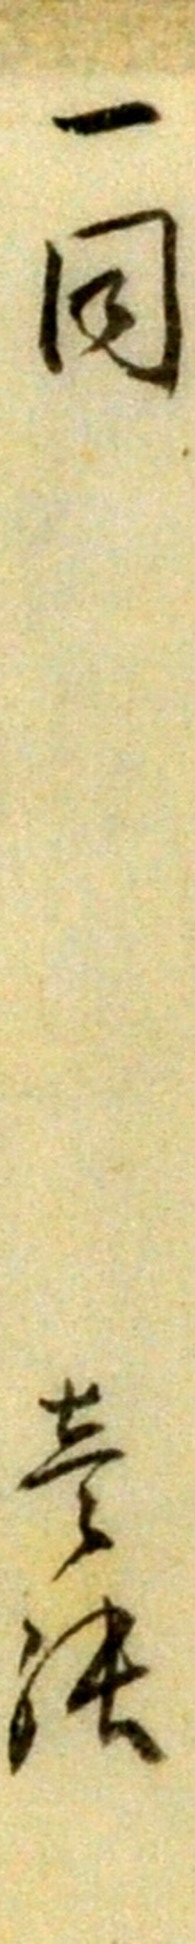一同壱張
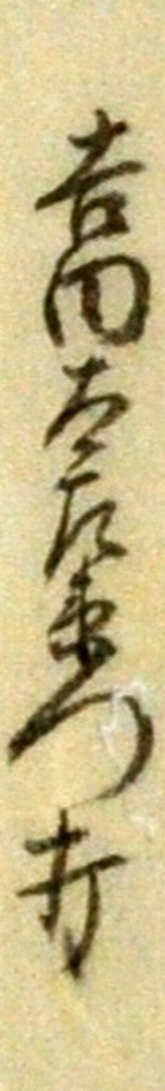吉田太左衛門打
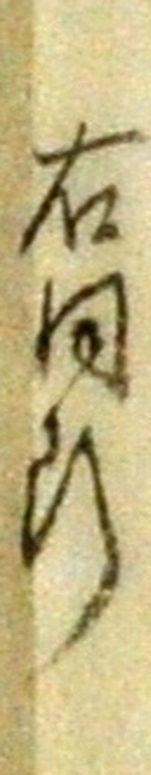右同断

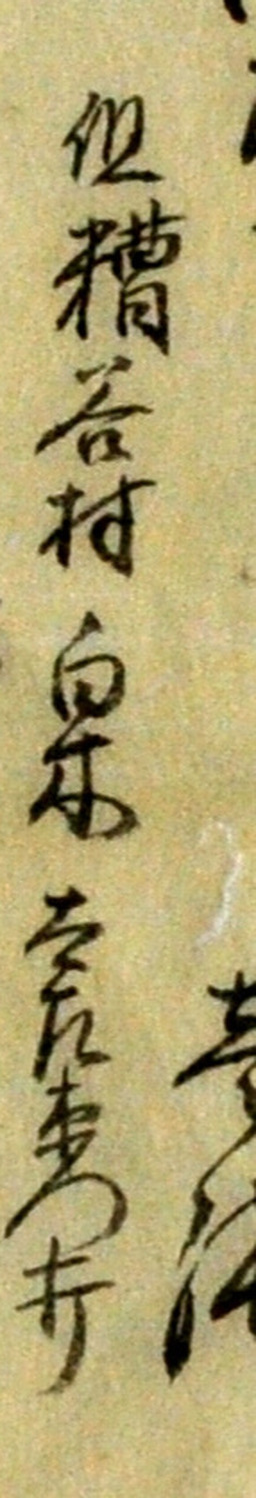但糟谷村白木太左衛門打
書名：目録
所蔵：伊那市立高遠町図書館・合同会社AMANE
